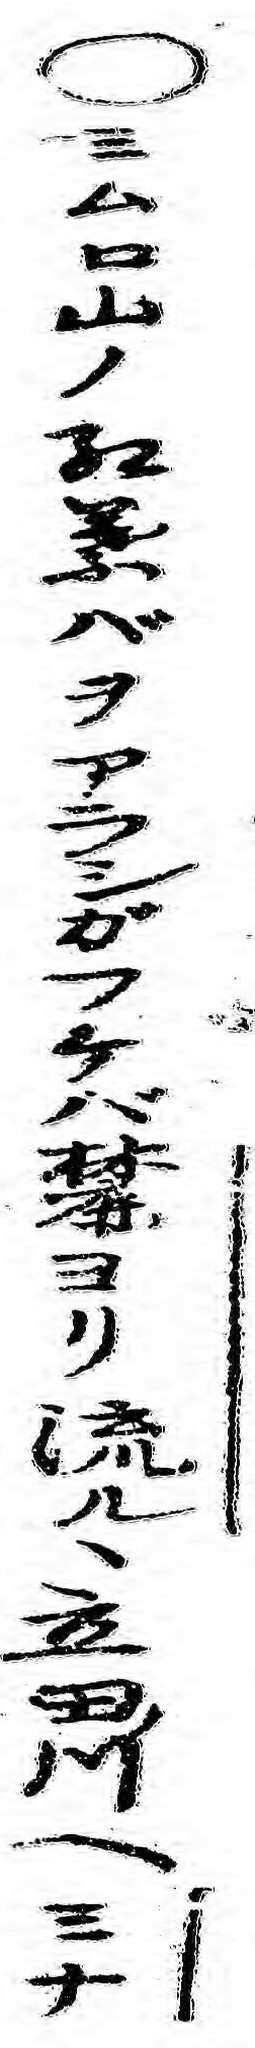○ミムロ山ノ紅葉バヲアラシガフケバ麓ヨリ流ルヽ立田川ヘミナ
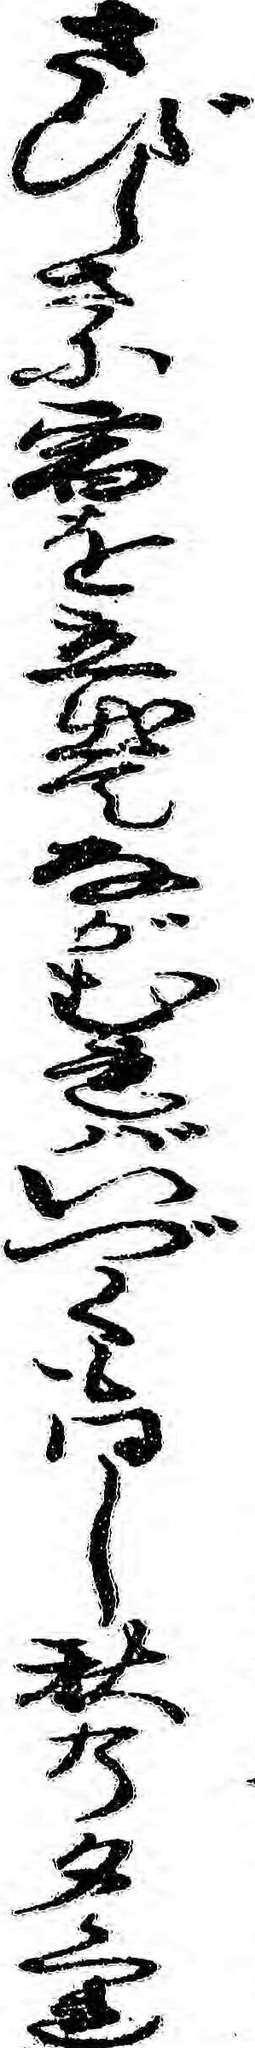さびしさに宿を立出てながむればいづくも同じ秋の夕ぐれ
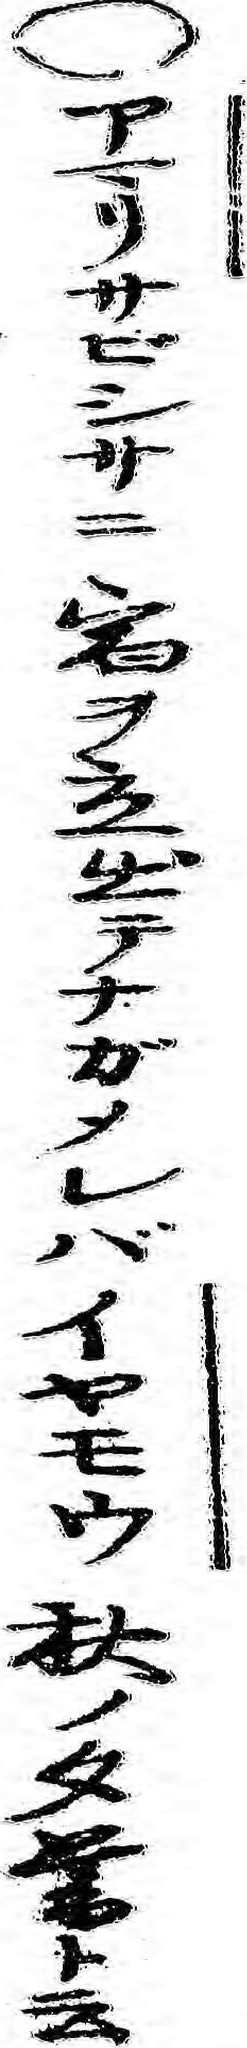○アマリサビシサニ宿ヲ立出テナガメレバイヤモウ秋ノ夕暮ト云
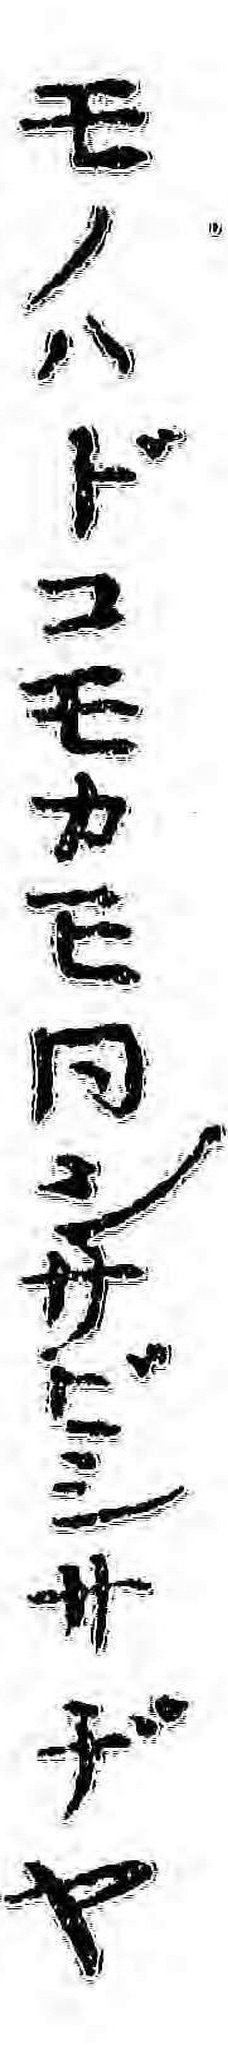モノハドコモカモ同シサビシサヂヤ
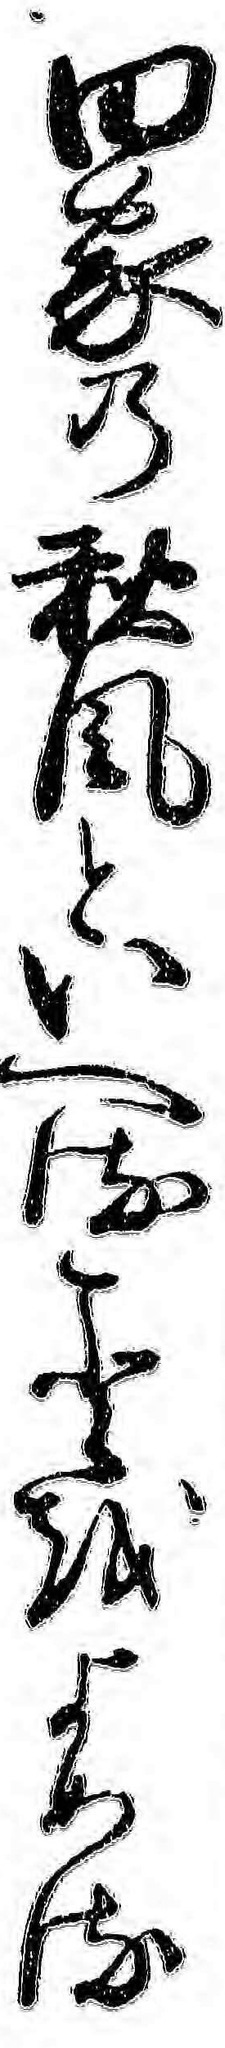田家の秋風といへることをよめる
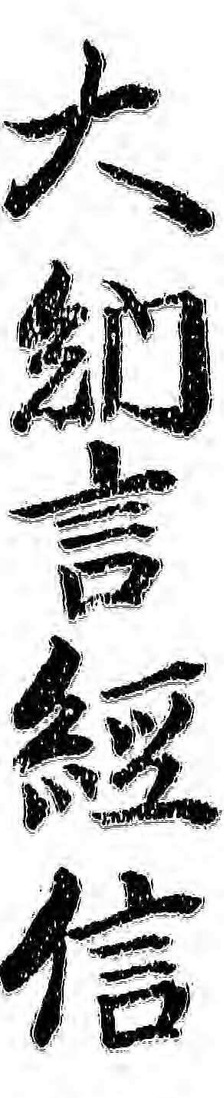大納言経信
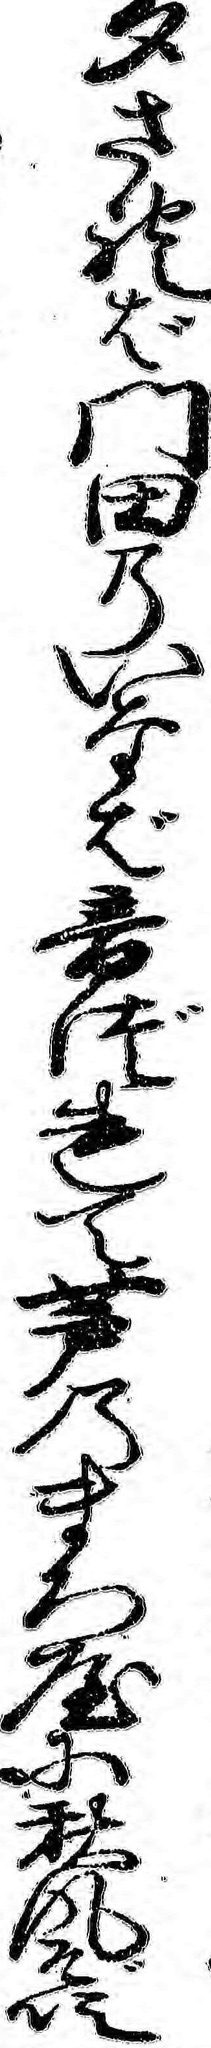夕されば門田のいなば音づれて芦のまろ屋に秋風ぞ吹
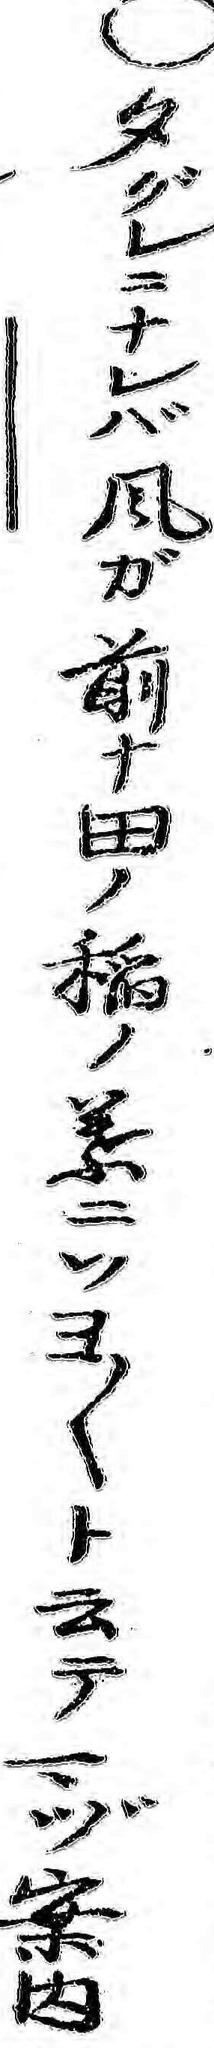○夕グレニナレバ風ガ前ナ田ノ稲ノ葉ニソヨ〳〵ト云テマヅ案内
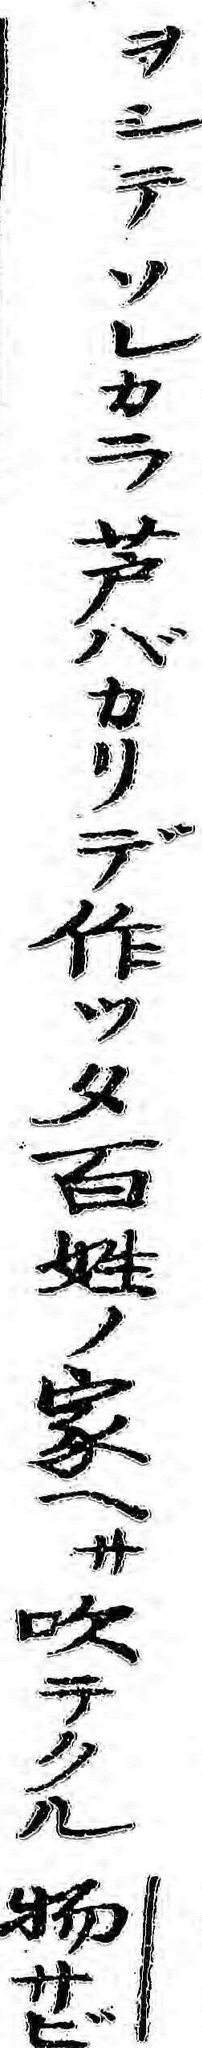ヲシテソレカラ芦バカリデ作ツタ百姓ノ家ヘ吹テクル物サビ
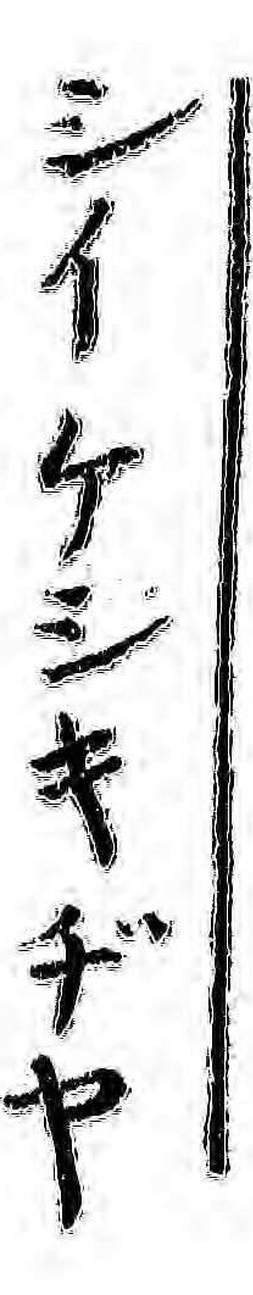シイケシキヂヤ
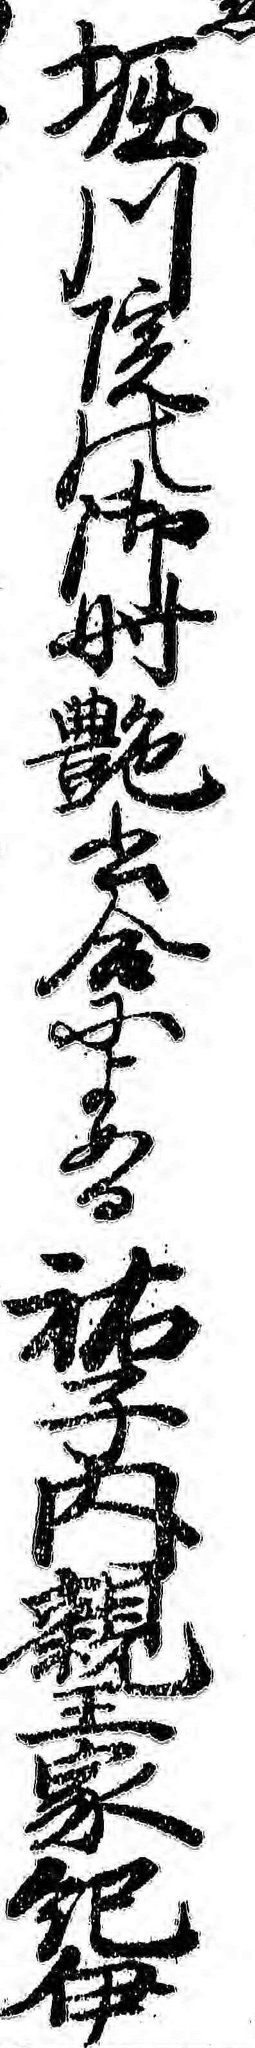金葉集恋堀川院の御時艶書合によめる祐子内親王家紀伊
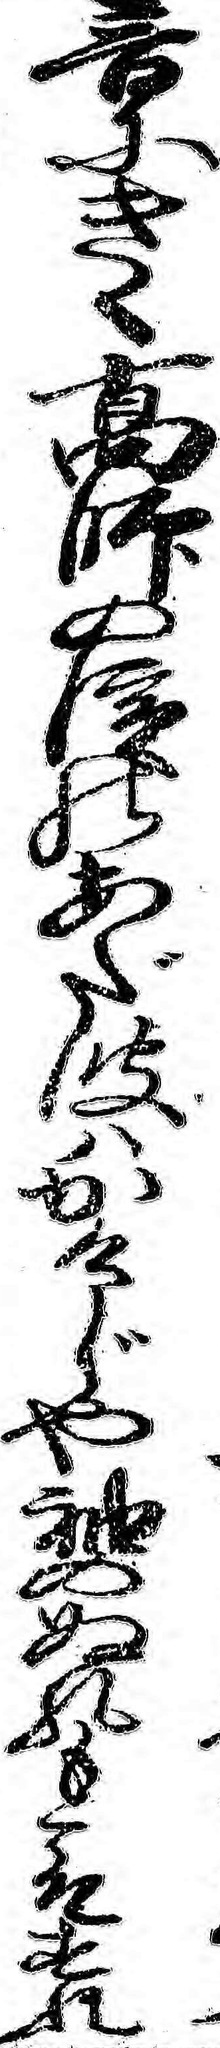音にきく高師の浜のあだ浪はかけじや袖のぬれもこそすれ
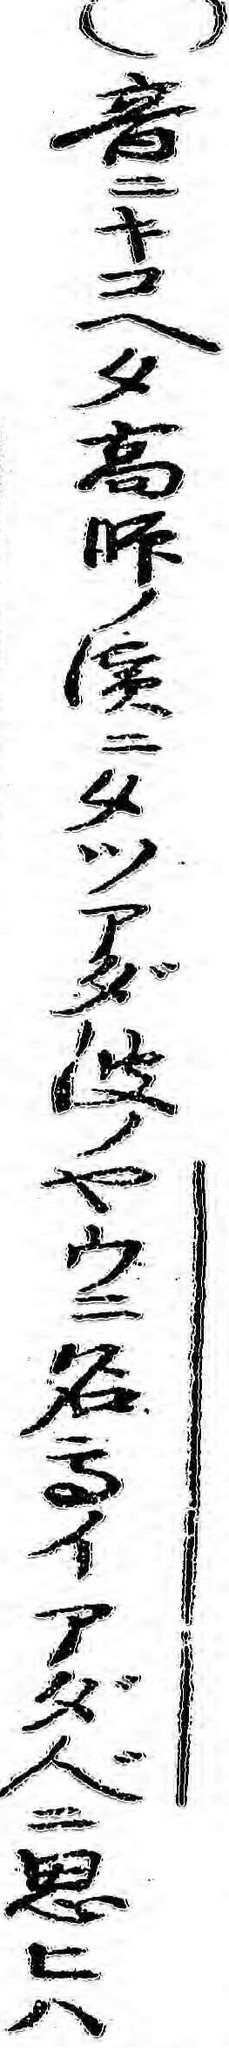○音ニキコヘタ高師ノ浜ニタツアダ波ノヤウニ名高イアダ人ニ思ヒハ
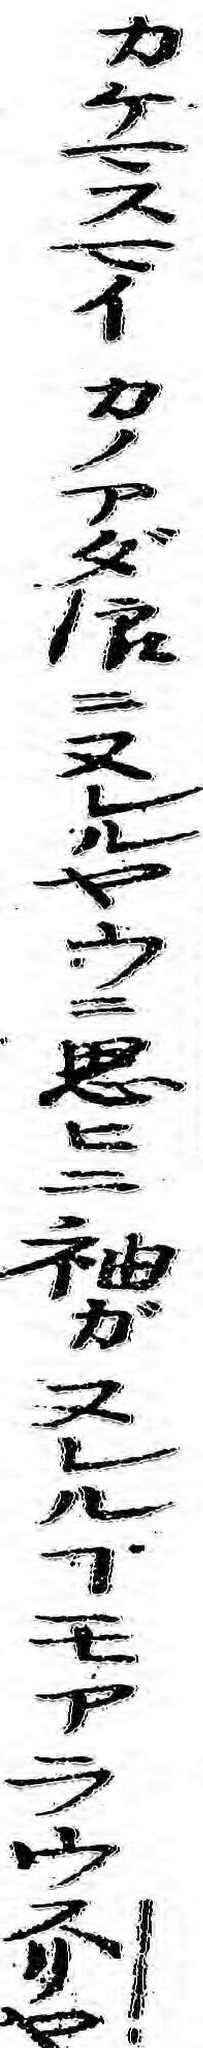カケマスマイカノアダ浪ニヌレルヤウニ思ヒニ袖ガヌレルコトモアラウスリヤ

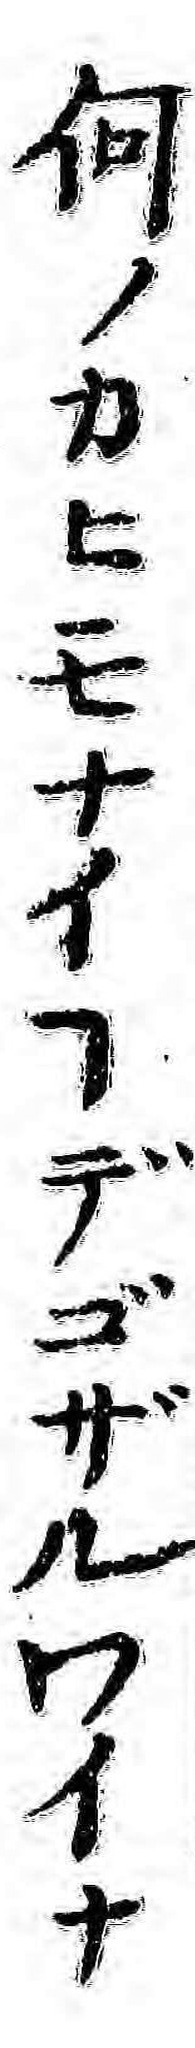何ノカヒモナイコトデゴザルワイナ
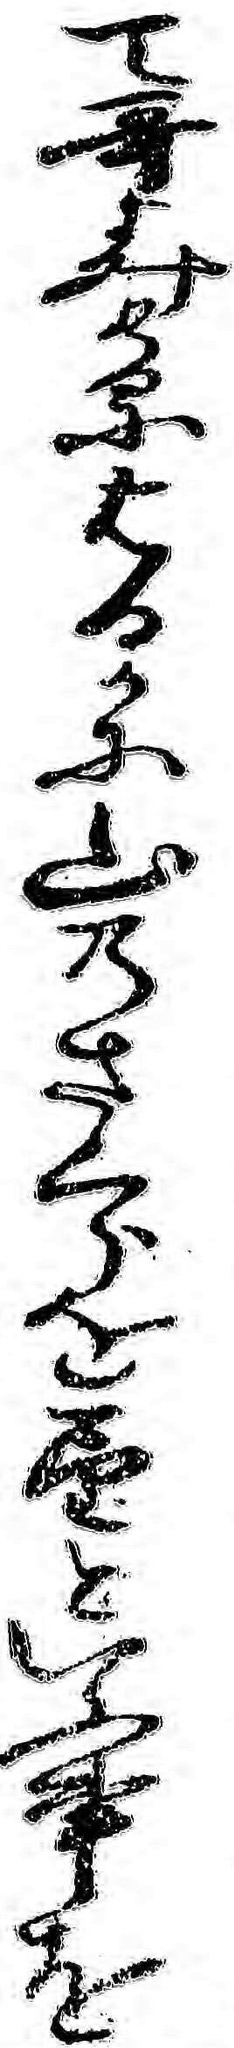て哥よみけるにはるかに山のさくらを望といふ事を
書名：百人一首／小倉の山ふみ
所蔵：国文学研究資料館
